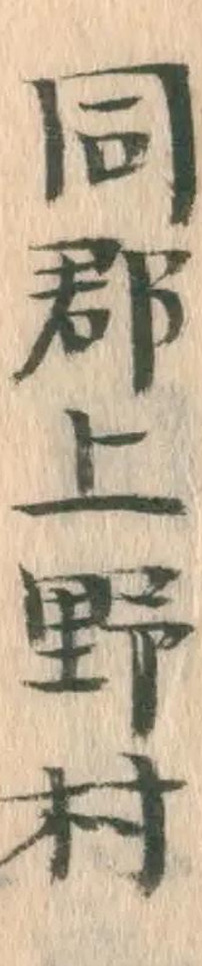同郡上野村
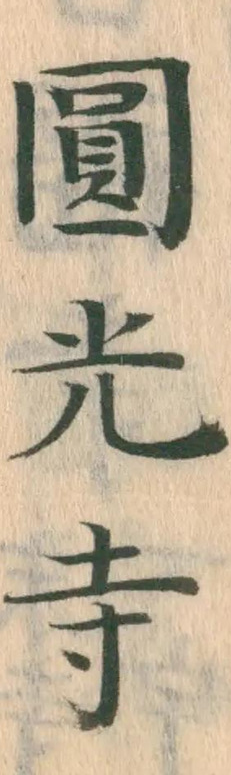圓光寺
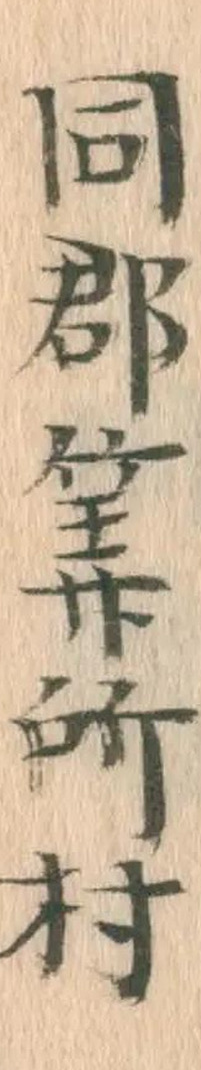同郡算所村
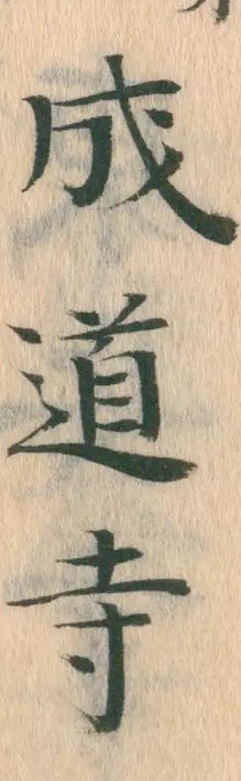成道寺
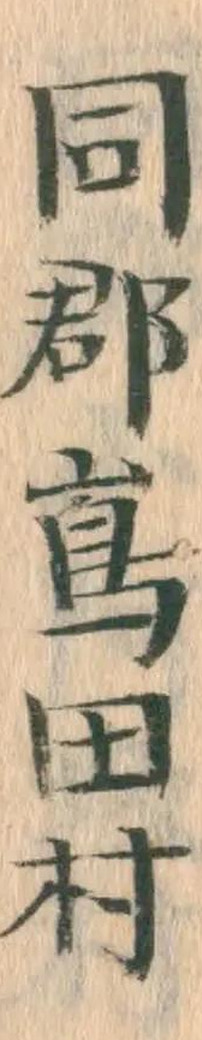同郡島田村
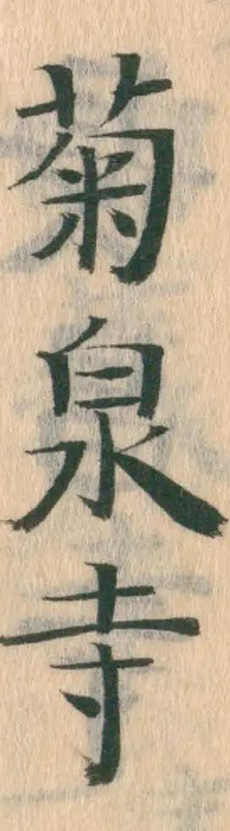菊水寺
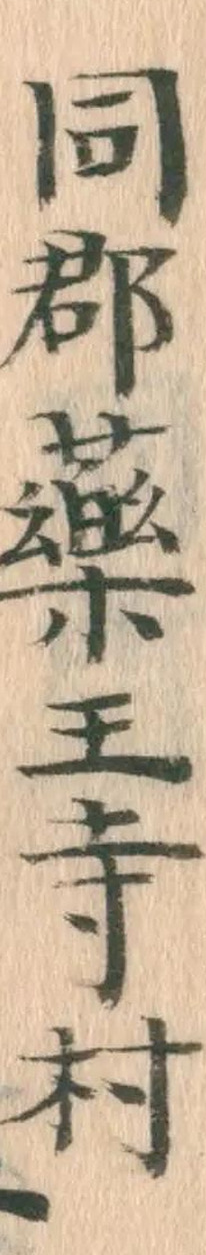同郡薬王寺村
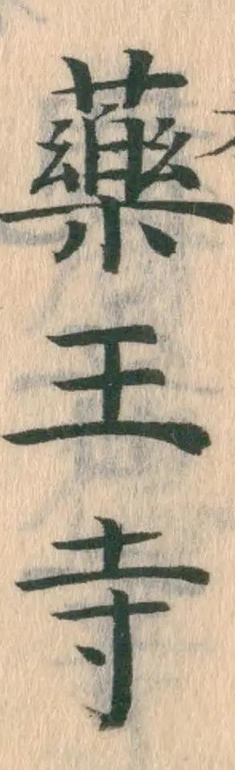薬王寺
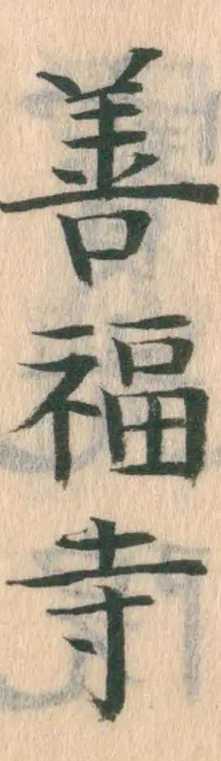善福寺
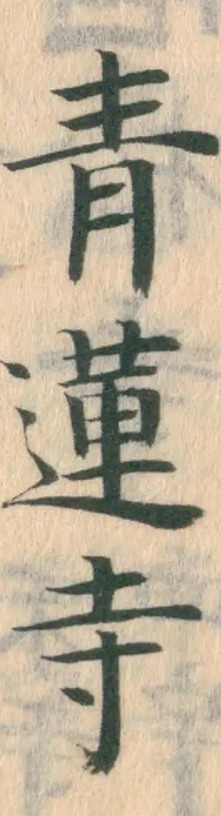青蓮寺

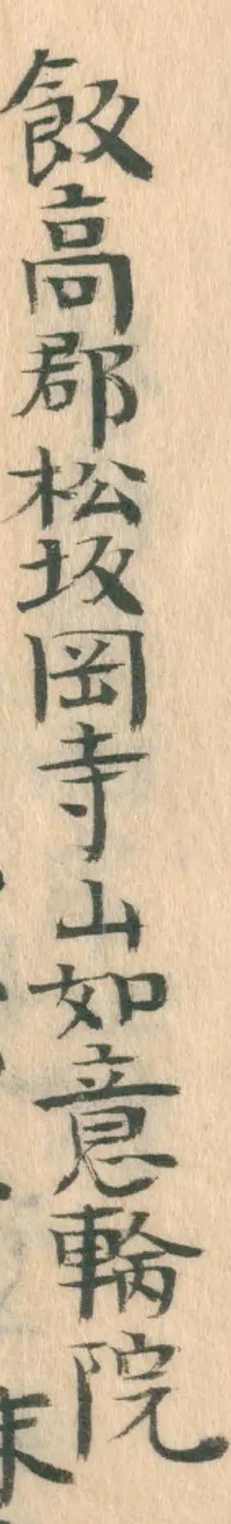飯高郡松坂岡寺山如意輪院
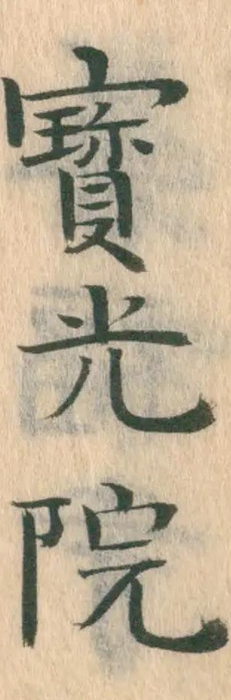寶光院
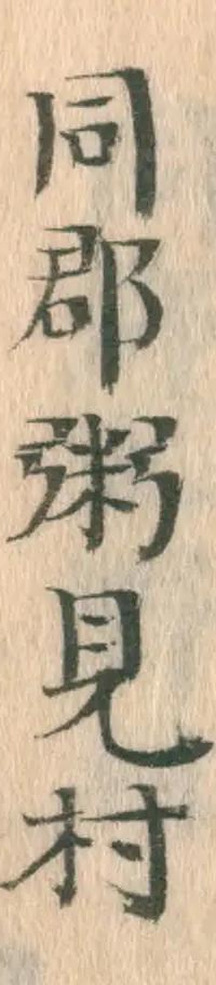同郡粥見村
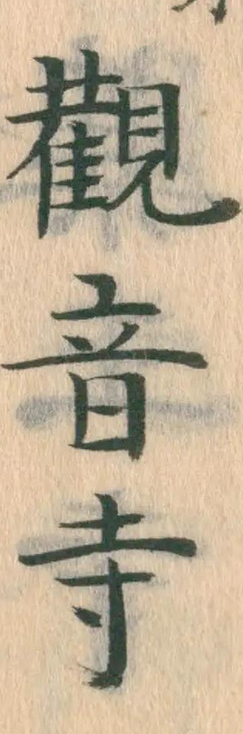観音寺
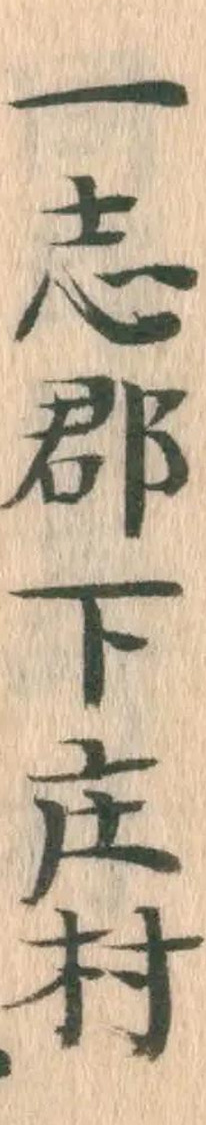一志郡下庄村
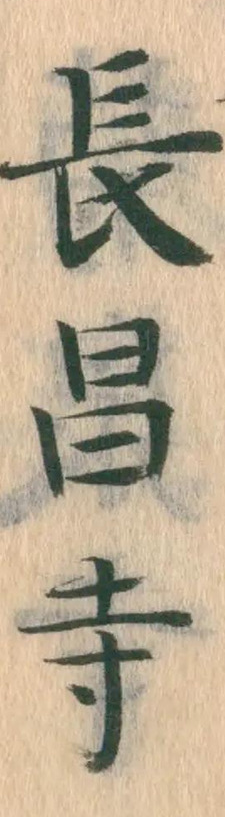長昌寺
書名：古義真言宗本末帳 21巻. [4] 第三 伊賀国、伊勢国、志摩国、尾張国、三河国、遠江国、駿河国、伊豆国、甲斐国
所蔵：国立国会図書館 National Diet Library, JAPAN
